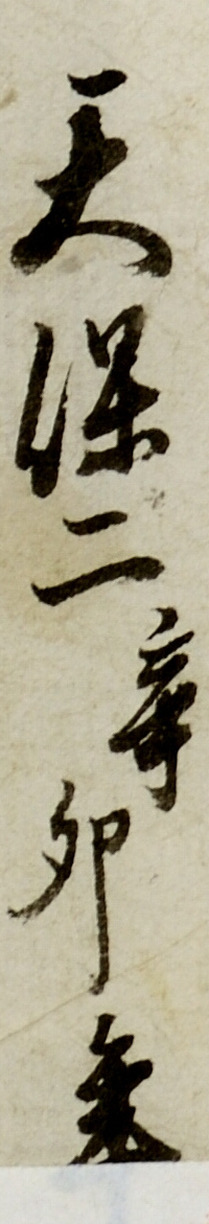天保二辛卯年
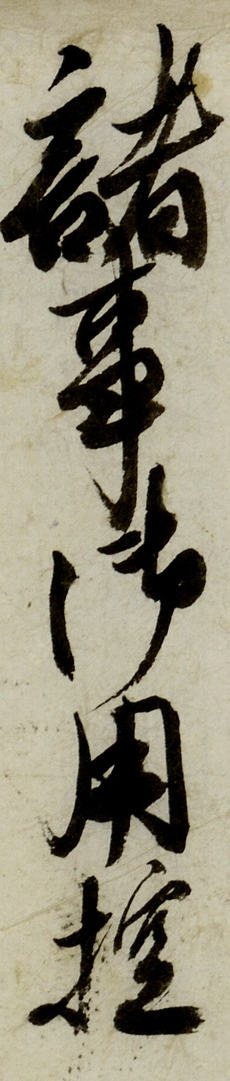諸事御用控
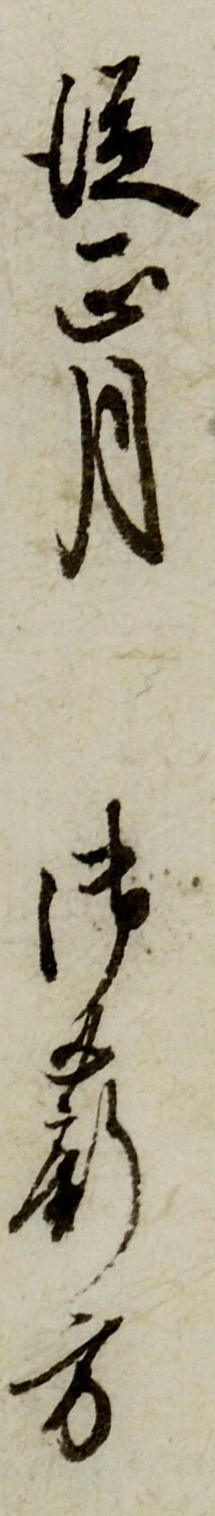従正月御薪方
